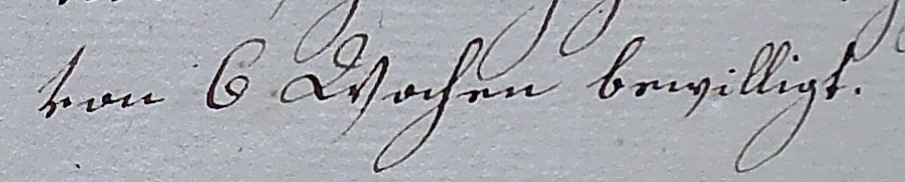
von 6 Wochen bewilligt.
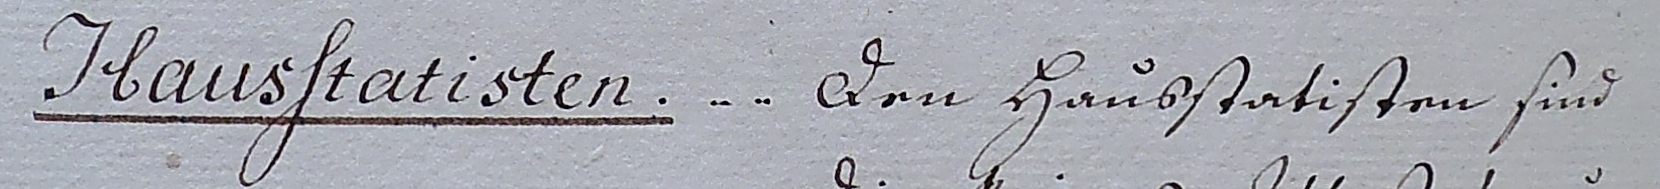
Hausstatisten. .. .. Den Hausstatisten sind
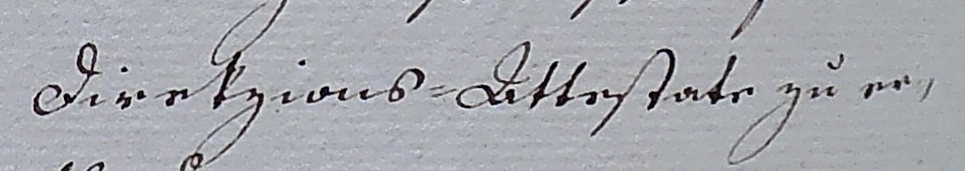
Direkzions=Atestate zu er¬
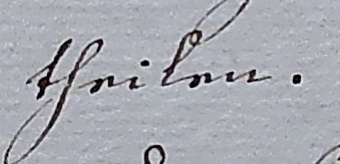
theilen.
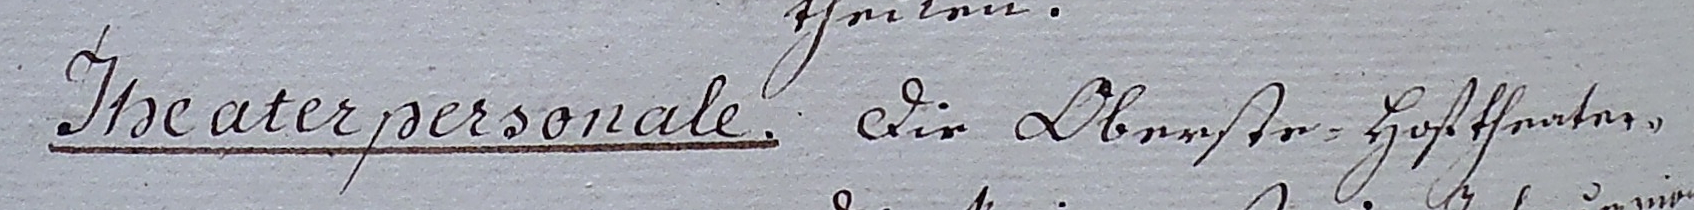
Theaterpersonale. Die Oberste=Hoftheater¬
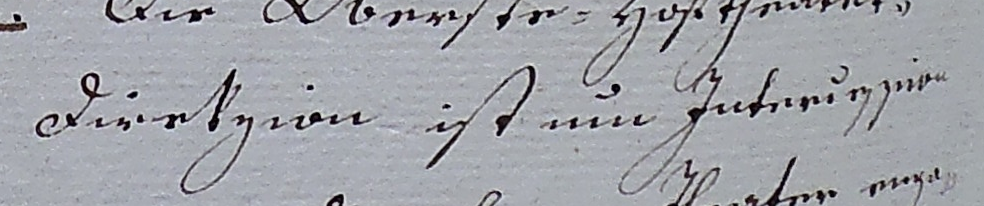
Direkzion ist um Intercession
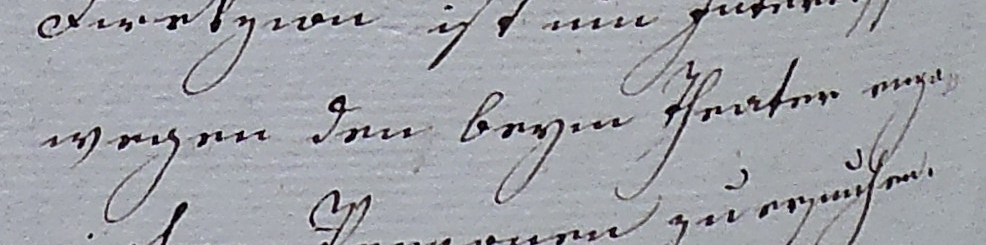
wegen den beym Theater enga¬
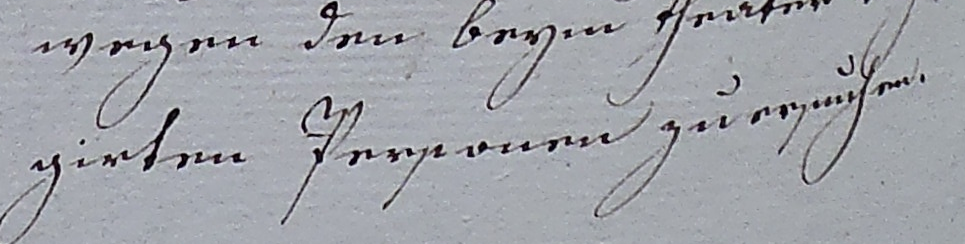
girten Personen zu ersuchen.
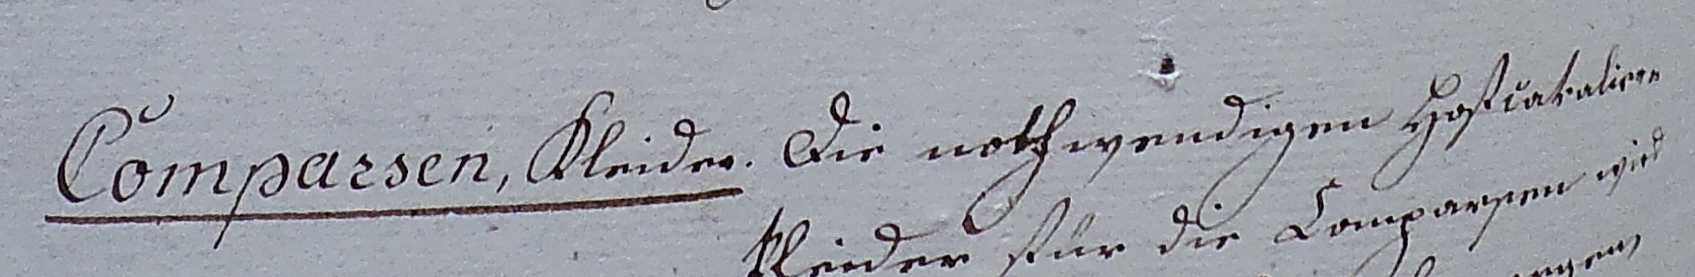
Comparsen, Kleider. Die nothwendigen Hofcavalire¬
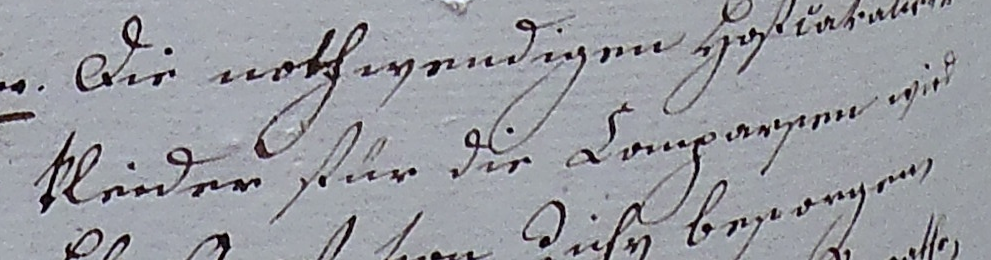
kleider für die Comparsen wird
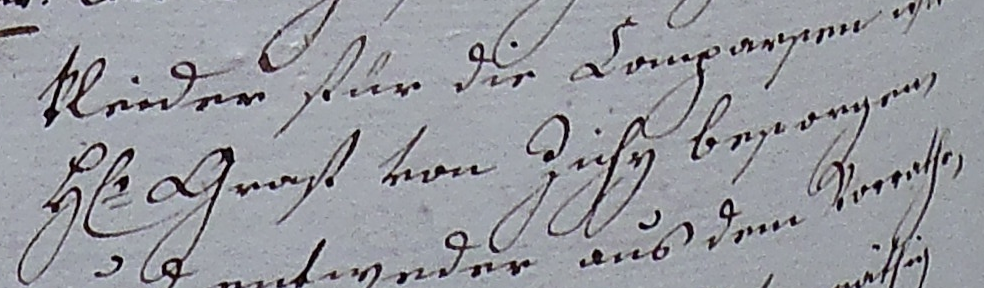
HEr͇ Graf von Zichy besorgen
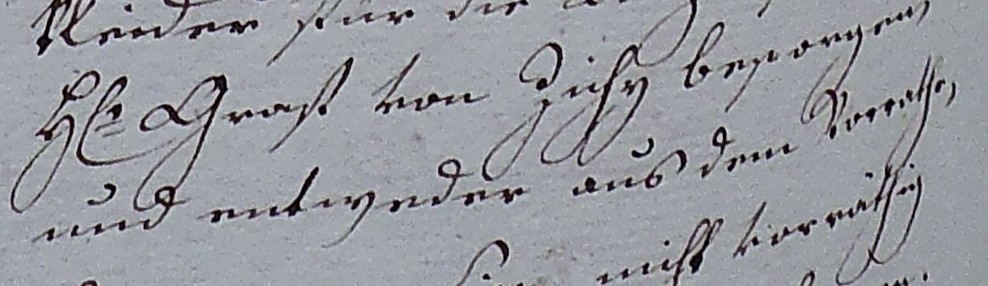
und entweder aus dem Vorrathe,
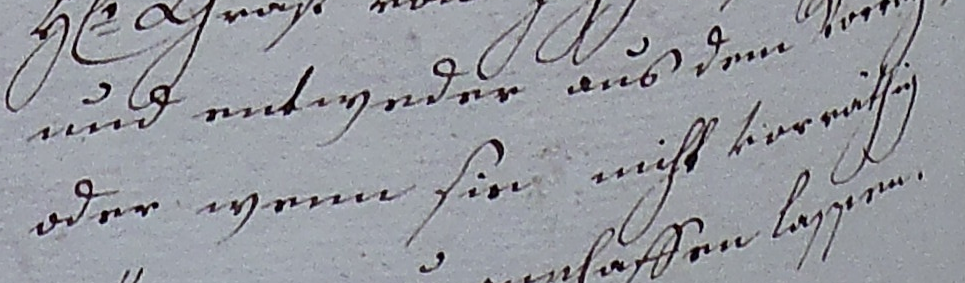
oder wenn sie nicht vorräthig
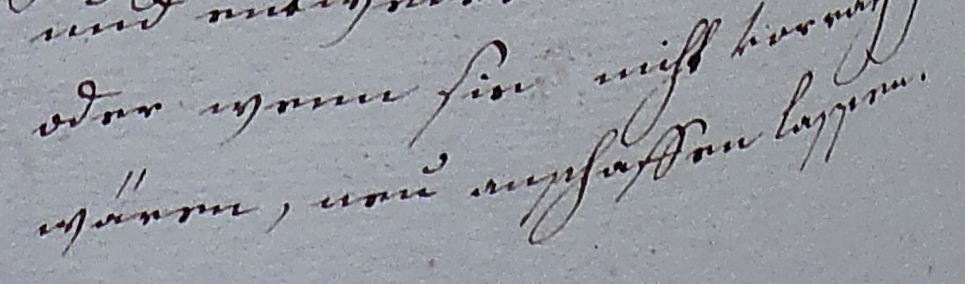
wären, neu anschäffen lassen.
